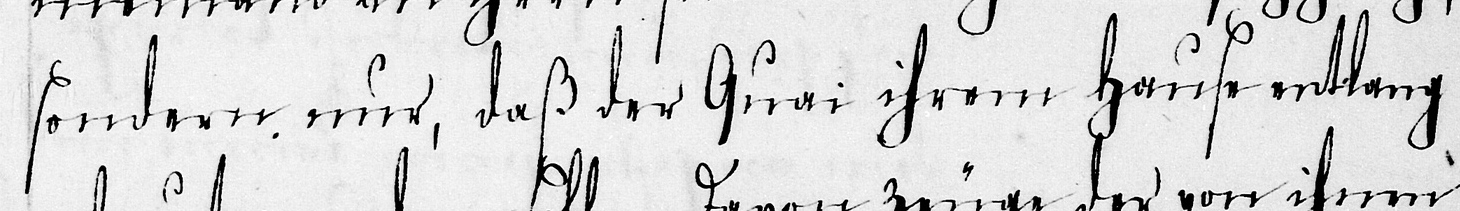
sondern nur, daß der Quai ihrem Haus entlang
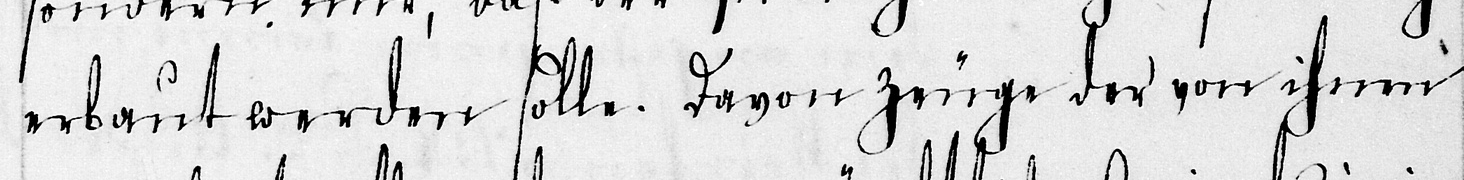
erbaut werden solle. Davon zeuge der von ihnen
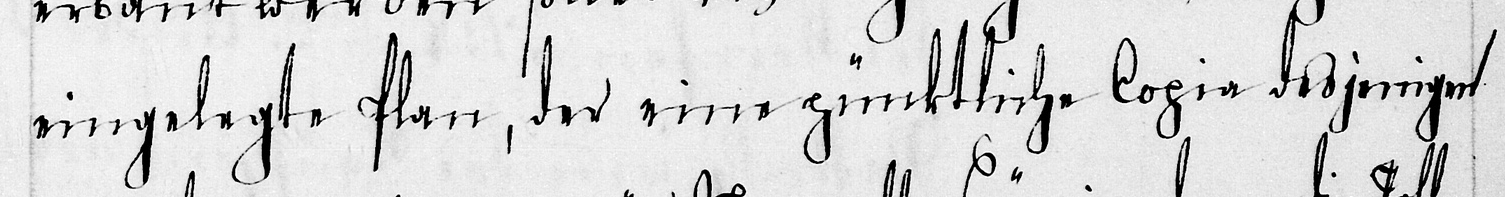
eingelegte Plan, der eine pünktliche Copie desjenigen
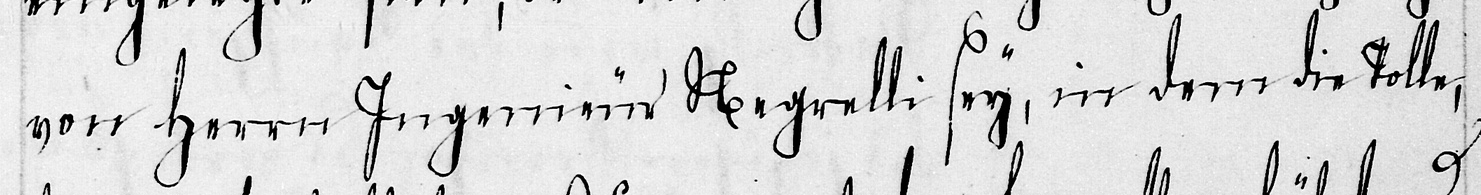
von Herrn Ingenieur Negrelli sey, in dem die Tolle,
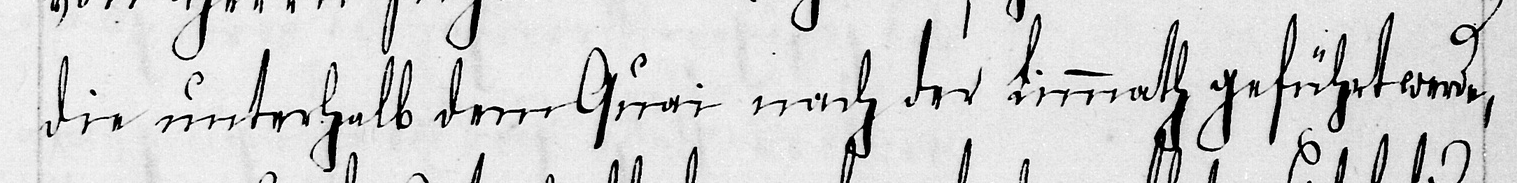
die unterhalb dem Quai nach der Limmath geführt werd¬
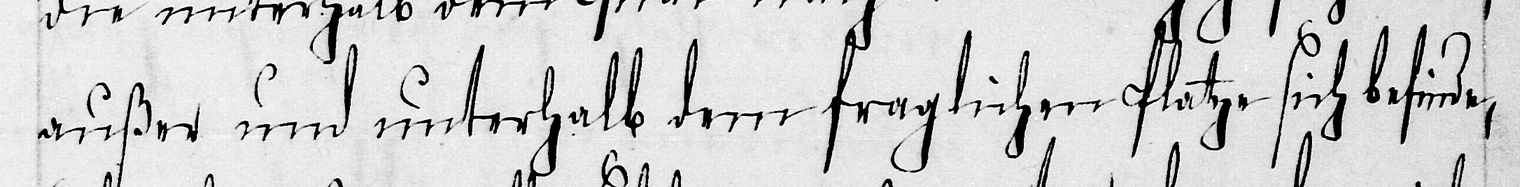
außer und unterhalb dem fraglichen Platze sich befin¬
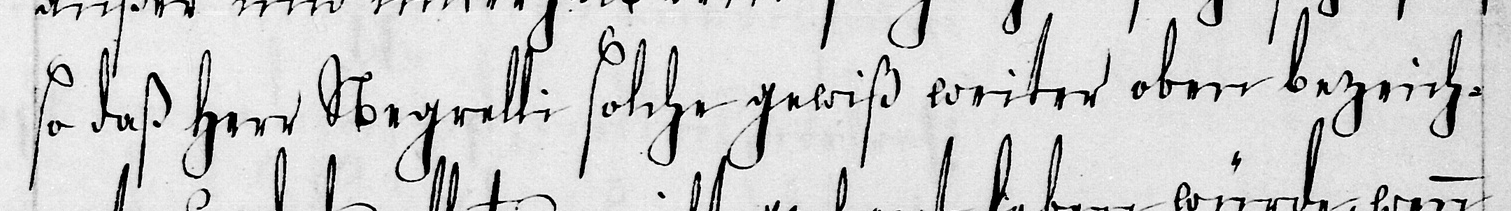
so daß Herr Negrelli solche gewiß weiter oben bezeich¬
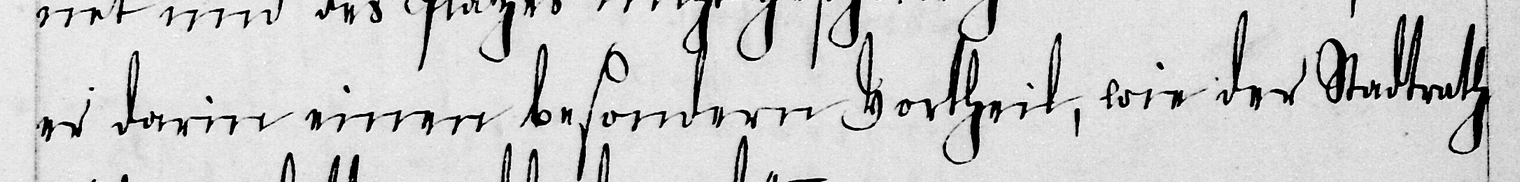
er darin einen besondern Vortheil, wie der Stadtrath
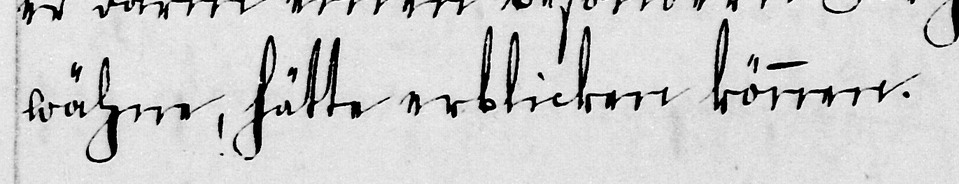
wähne, hätte erblicken können.
